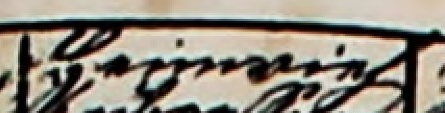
Heimvieh
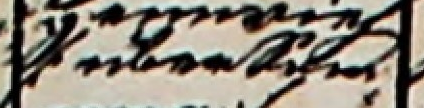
über S???
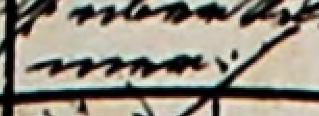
mer.
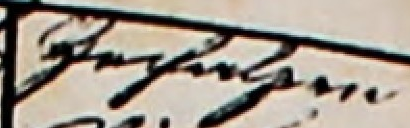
Zechalgen
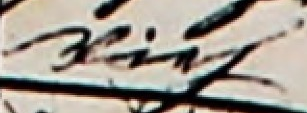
Vieh
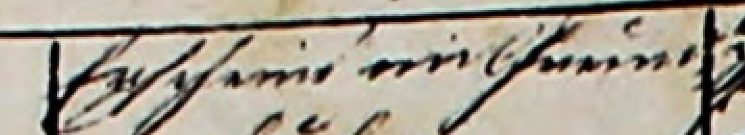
Erscheint im Grund„
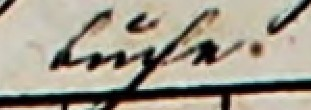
buche
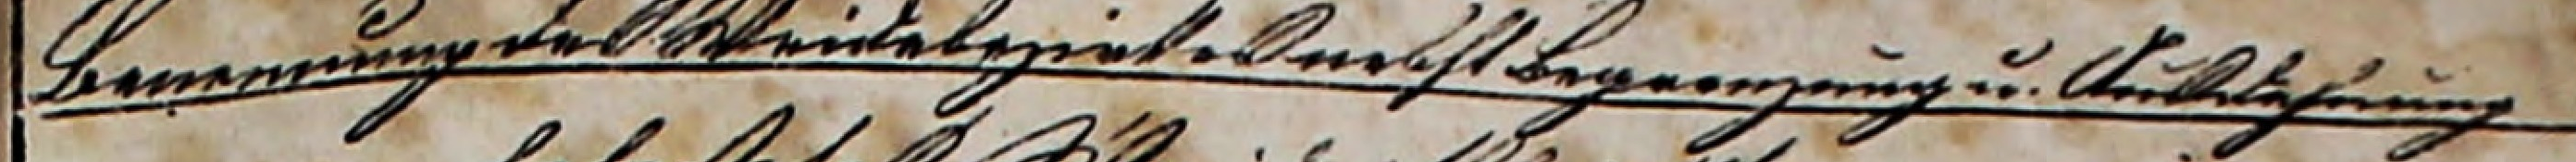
Benennung des Weidabezirkes nebst Begrenzung u. Ausdehnung
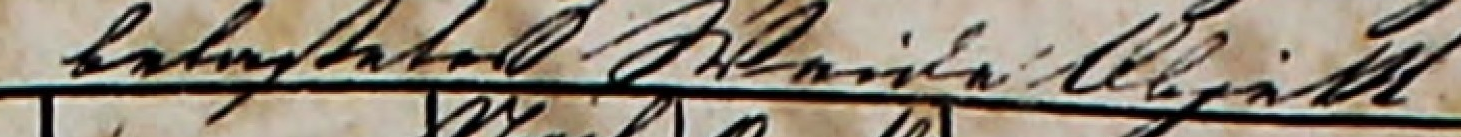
belaßetes Weide Objekt
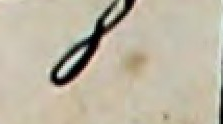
8
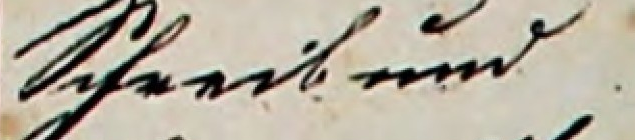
Schreib und
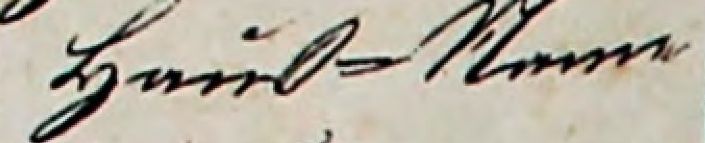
Haus=Name
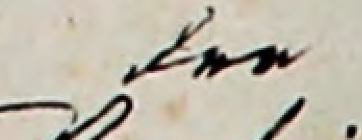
der
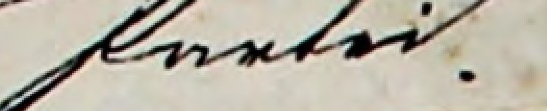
Partei
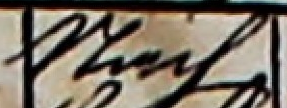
Nach
